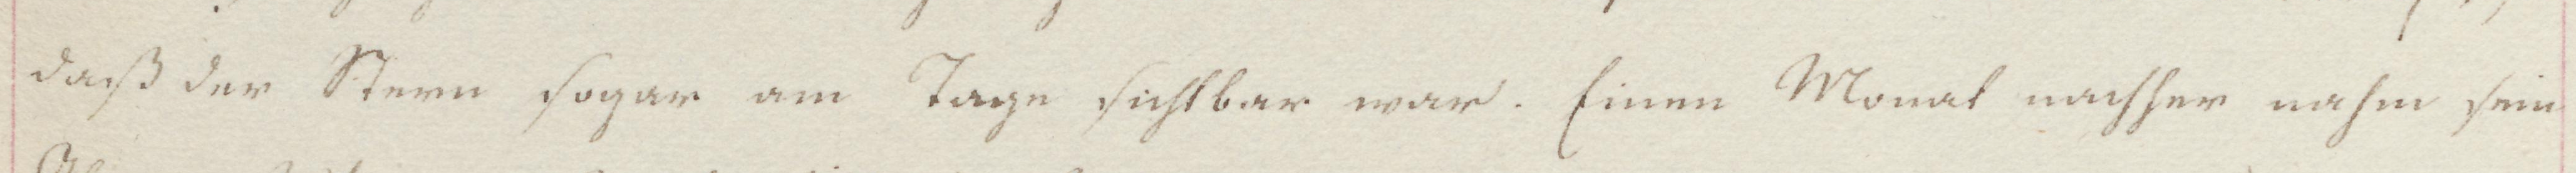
daß der Stern sogar am Tage sichtbar war. Einen Monat nachher nahm sein
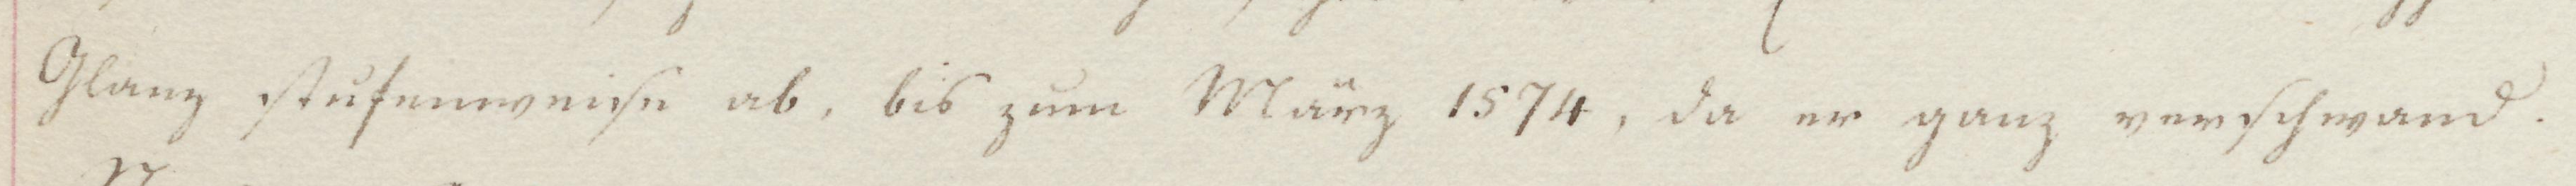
Glanz stufenweise ab, bis zum März 1574, da er ganz verschwand.
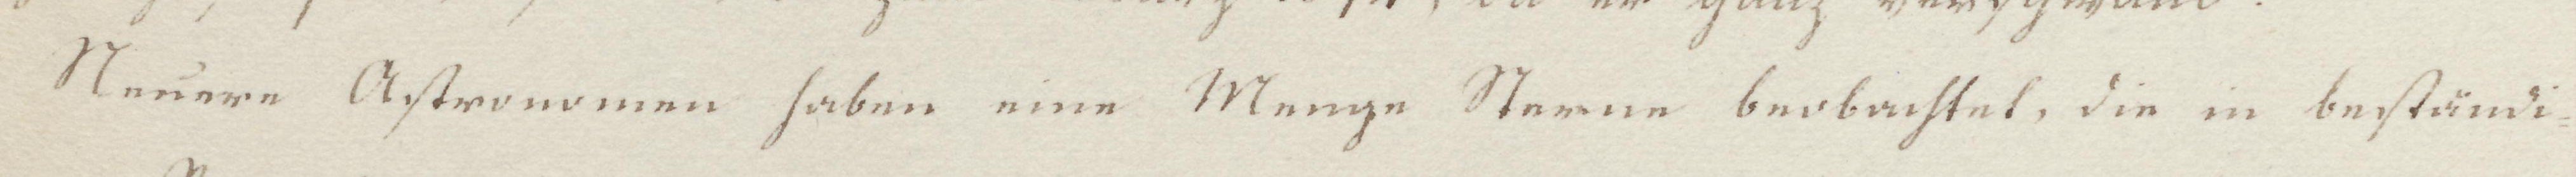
Neuere Astronomen haben eine Menge Sterne beobachtet, die in beständi-
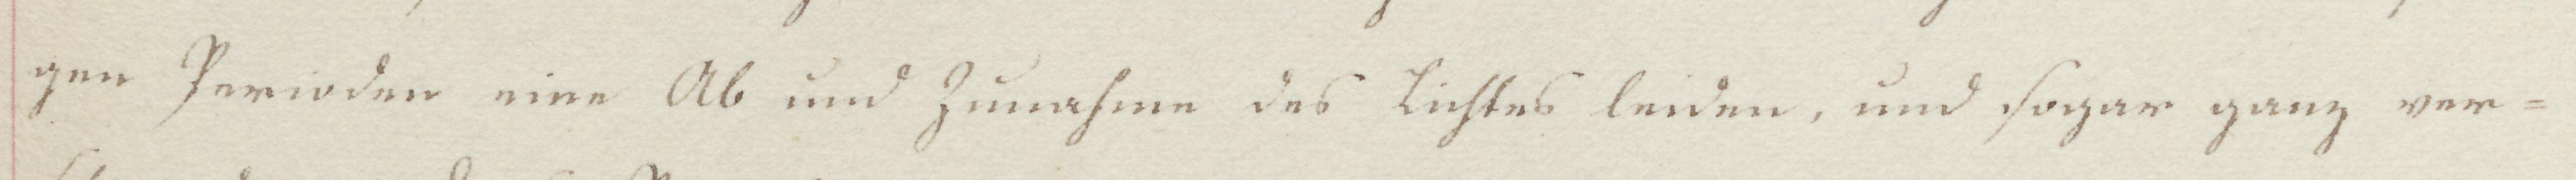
gen Perioden eine Ab und Zunahme des Lichtes leiden, und sogar ganz ver-
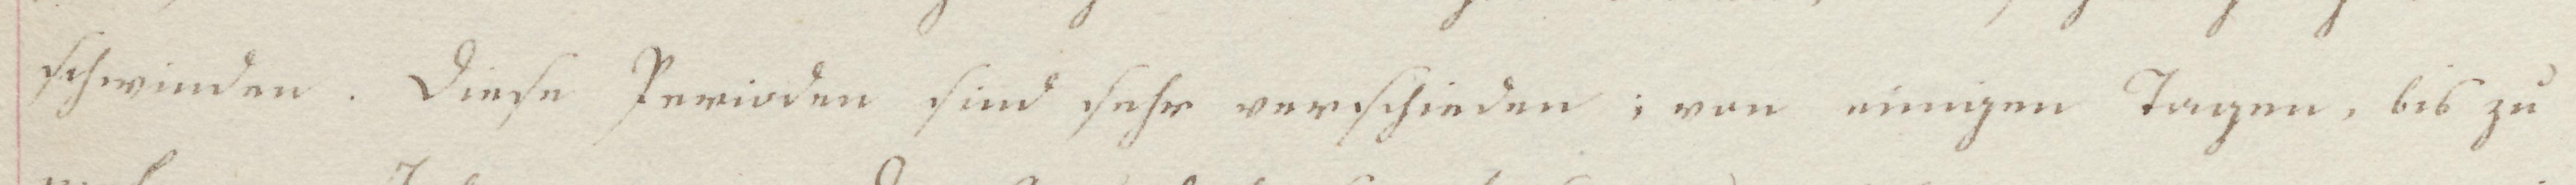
schwinden. Diese Perioden sind sehr verschieden; von einigen Tagen, bis zu
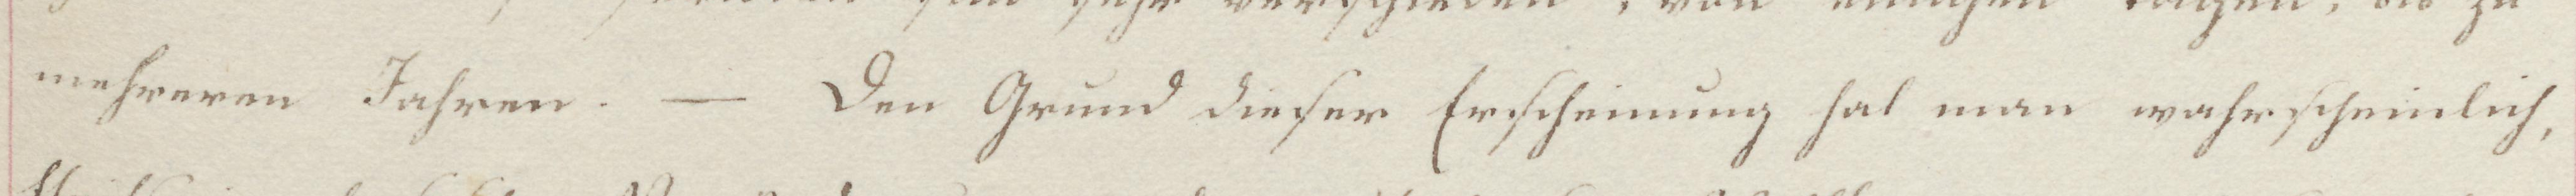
mehreren Jahren. – Den Grund dieser Erscheinung hat man wahrscheinlich,
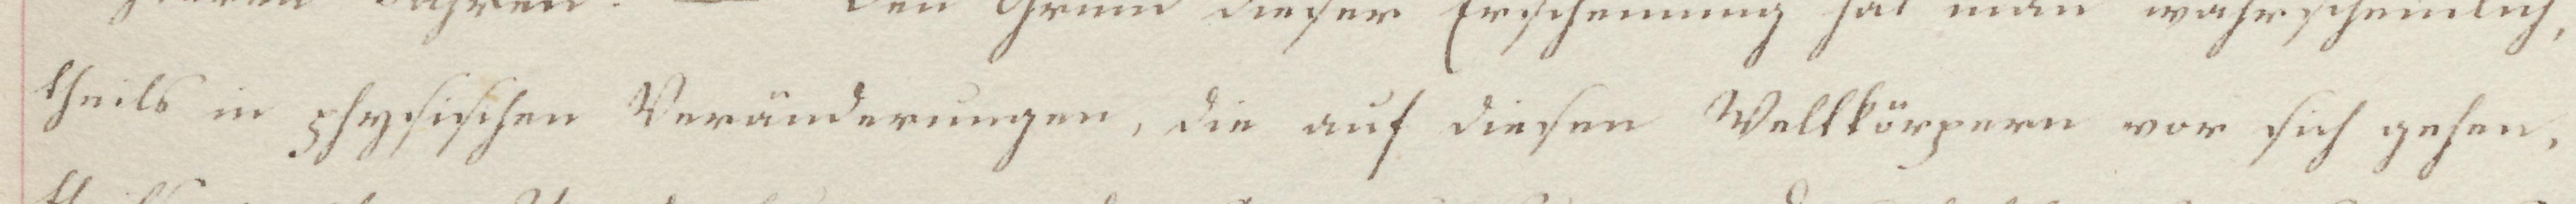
theils in physischen Veränderungen, die auf diesen Weltkörpern vor sich gehen,
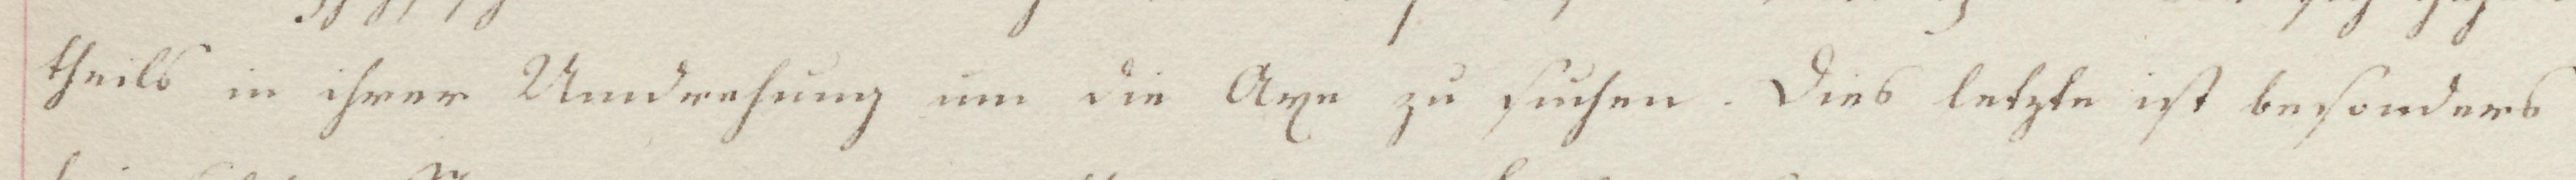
theils in ihrer Umdrehung um die Axe zu suchen. Dies letzte ist besonders
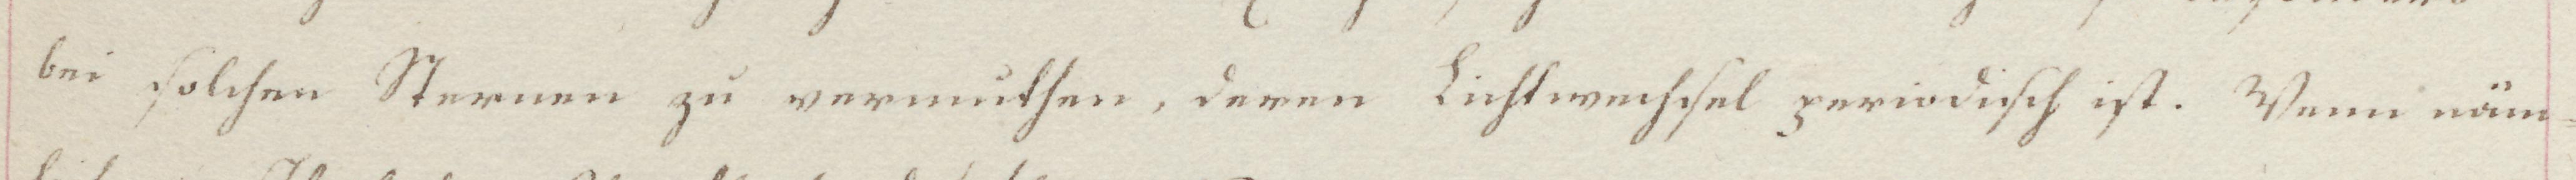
bei solchen Sternen zu vermuthen, deren Lichtwechsel periodisch ist. Wenn näm-
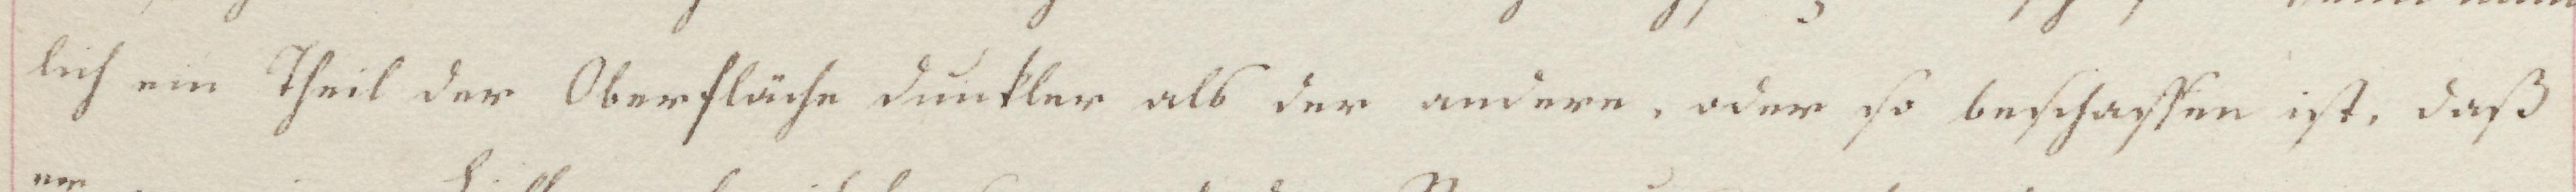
lich ein Theil der Oberfläche dunkler als der andere, oder so beschaffen ist, daß
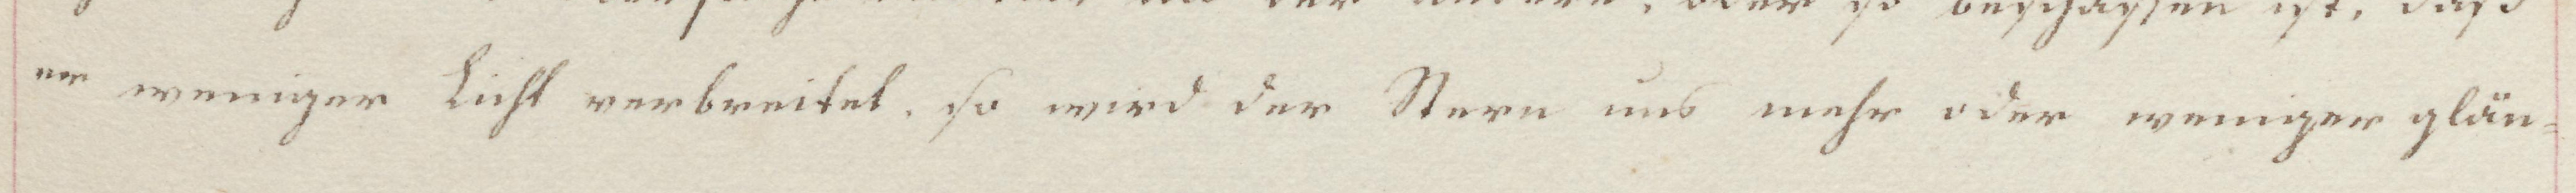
er weniger Licht verbreitet, so wird der Stern uns mehr oder weniger glän-
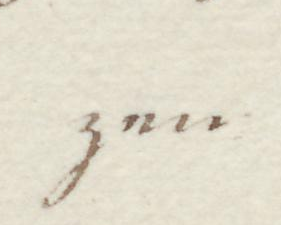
zen
